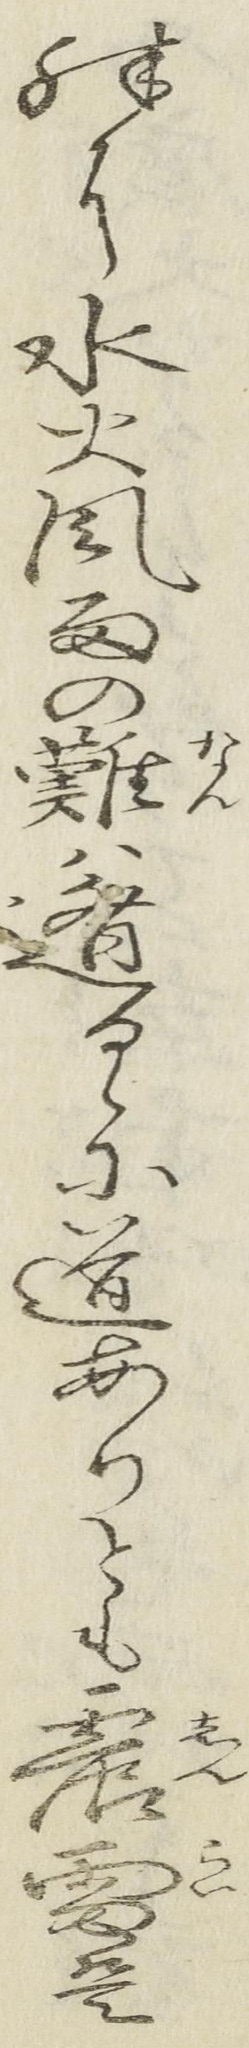誠に水火風雨の難は遁るゝに道ありとも震雷是
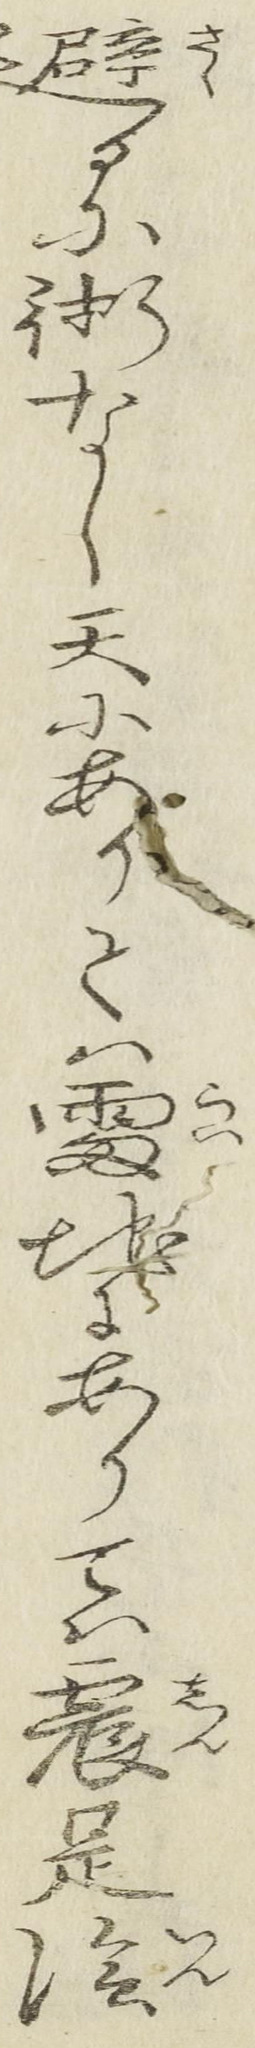避るに術なし天にありては雷地にありては震是陰
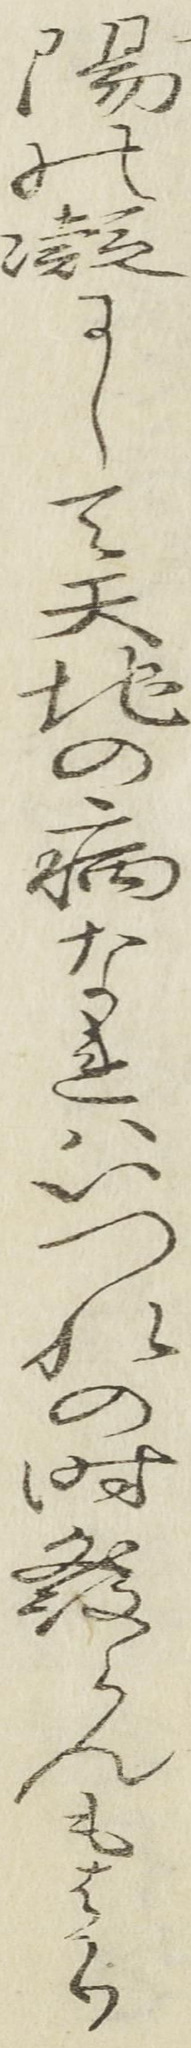陽の凝にして天地の病なれはいつれの時発らんもはかり
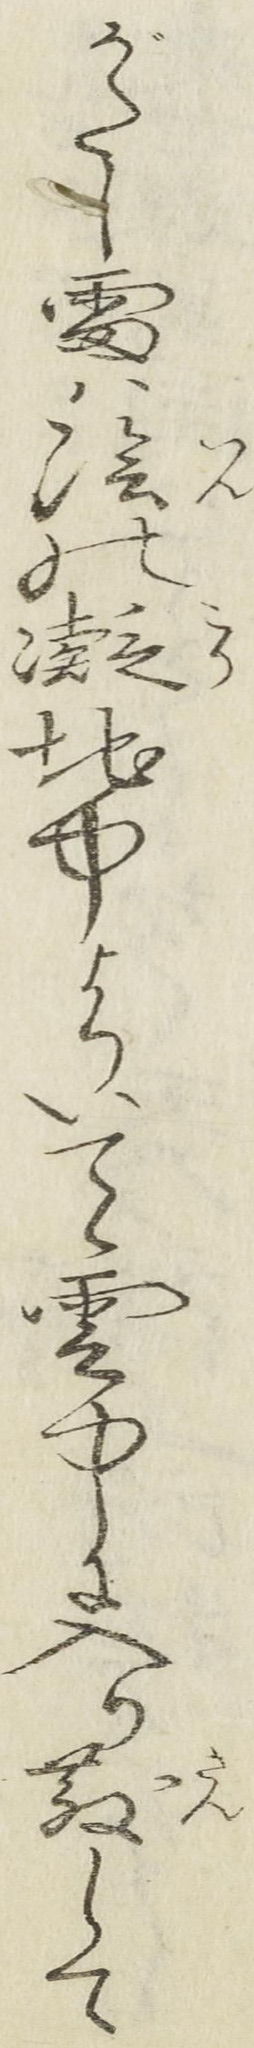がたし雷は陰の凝地中よりいてゝ雲中に入り散して
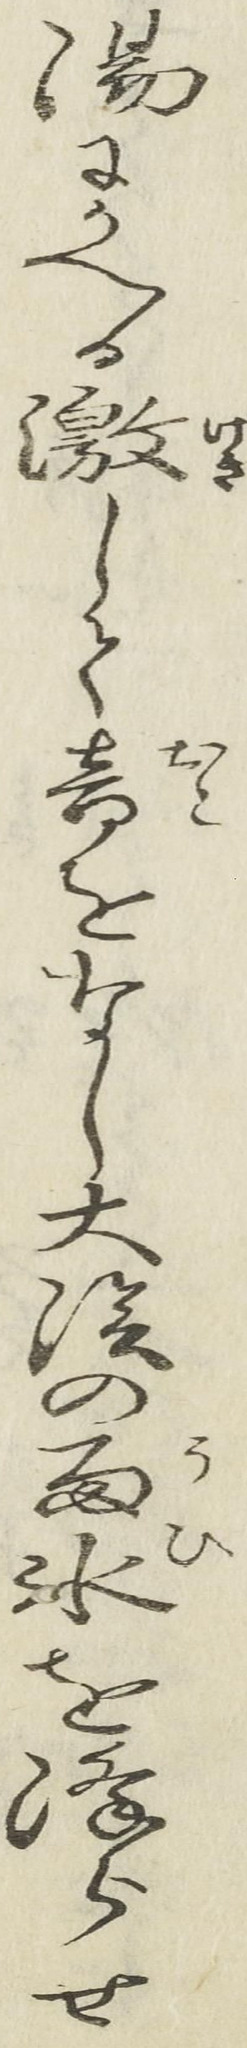陽にかへる激して音をなし大陰の雨氷を降らせ
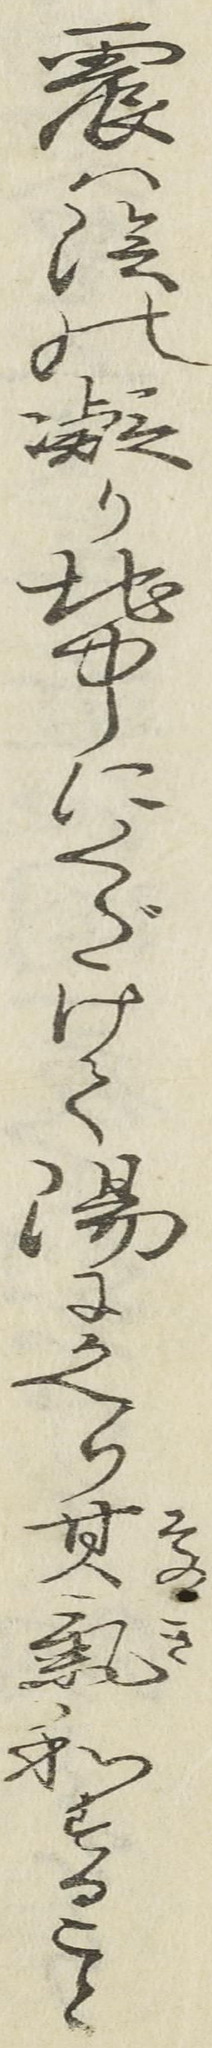震は陰の凝り地中にくだけて陽にかへり其気和すること
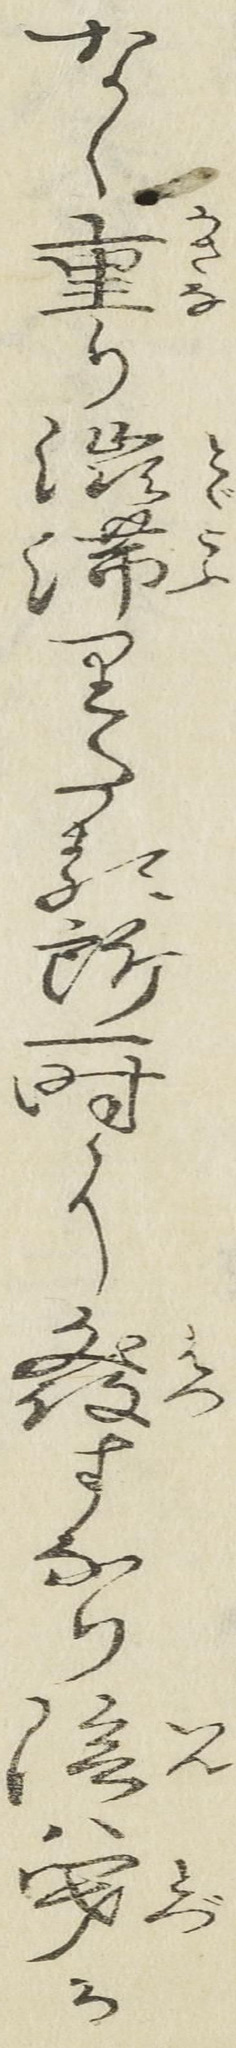なく重り渋滞りたる所一時に発すなり陰は閉る
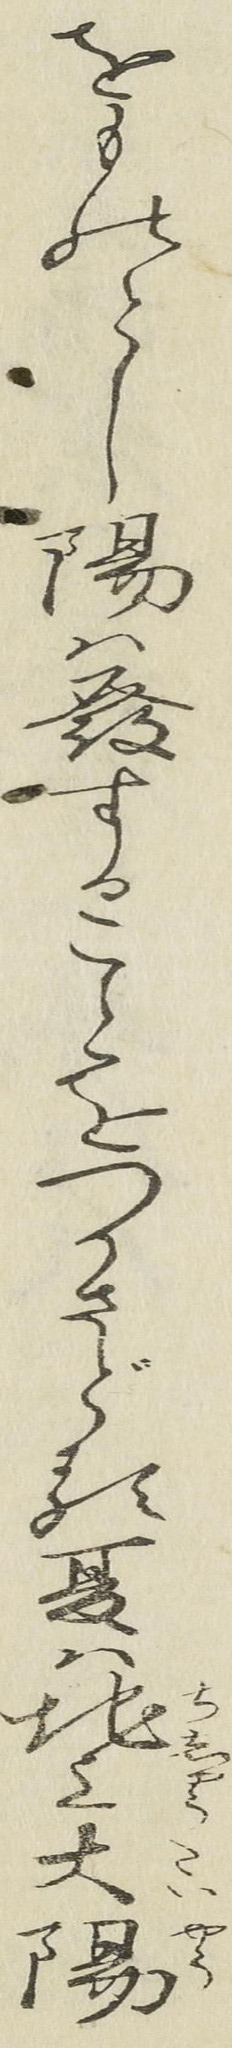をものとし陽は発することをつかさどる夏は地上大陽
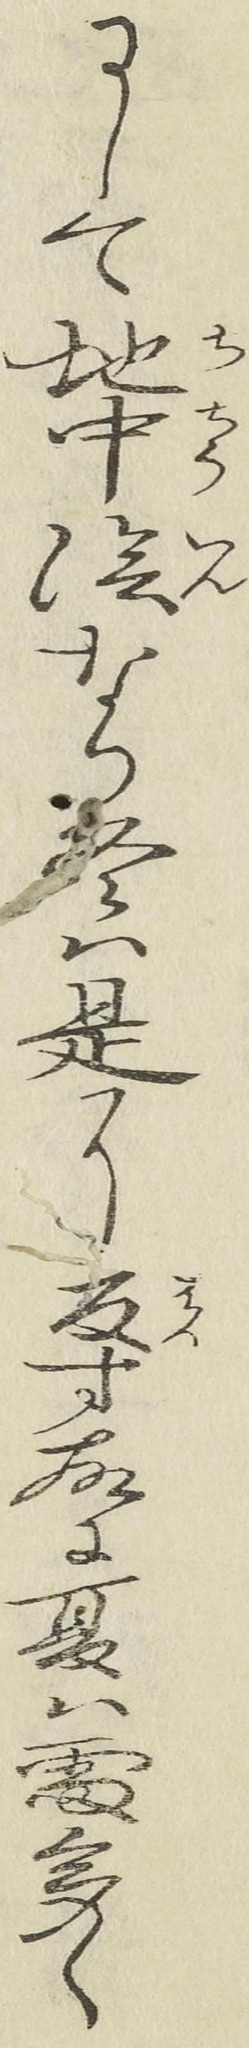にして地中陰なり冬は是に反す故に夏は雷多く
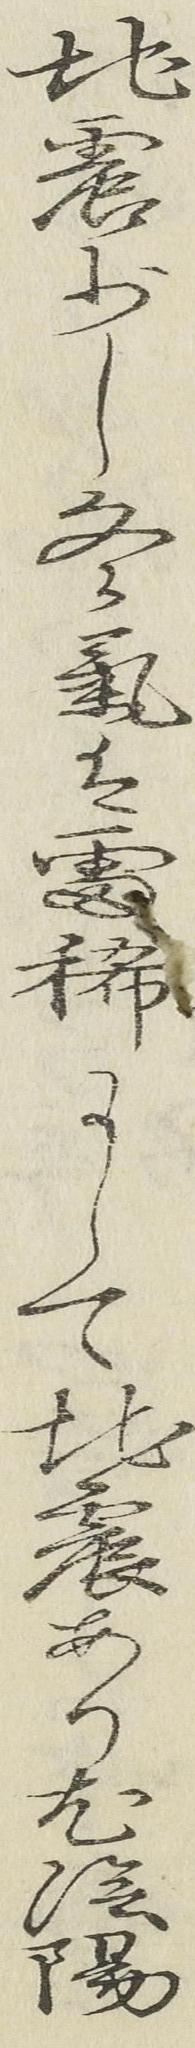地震少し冬氣は雷稀にして地震あり尤陰陽
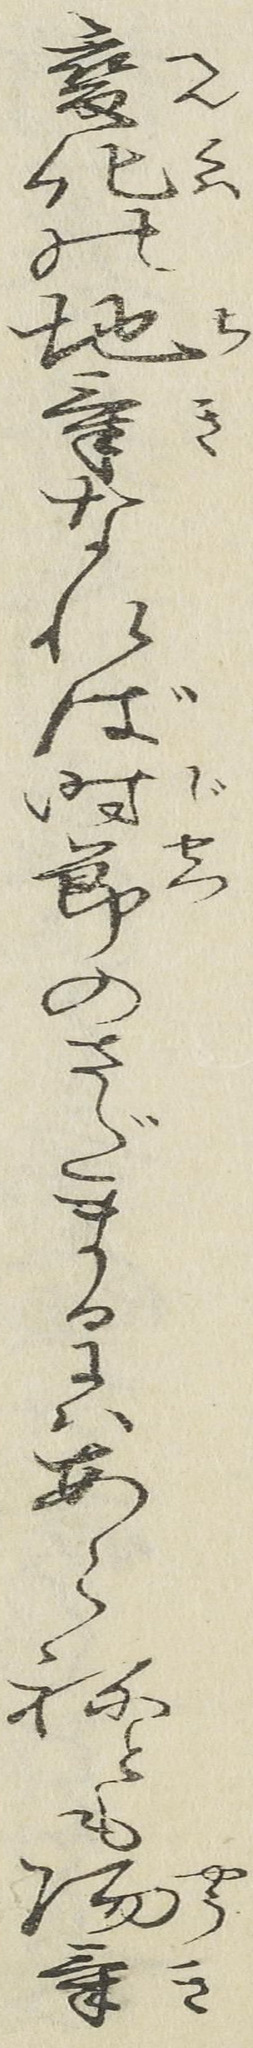変化の地気なれば時節のさだまるにはあらねとも陽気
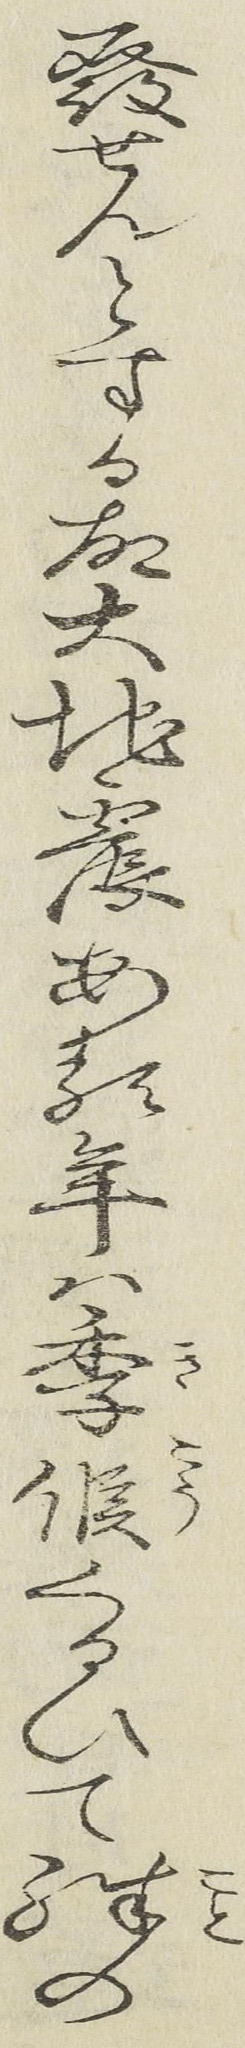発せんとする故大地震ある年は季候くるひて殊の
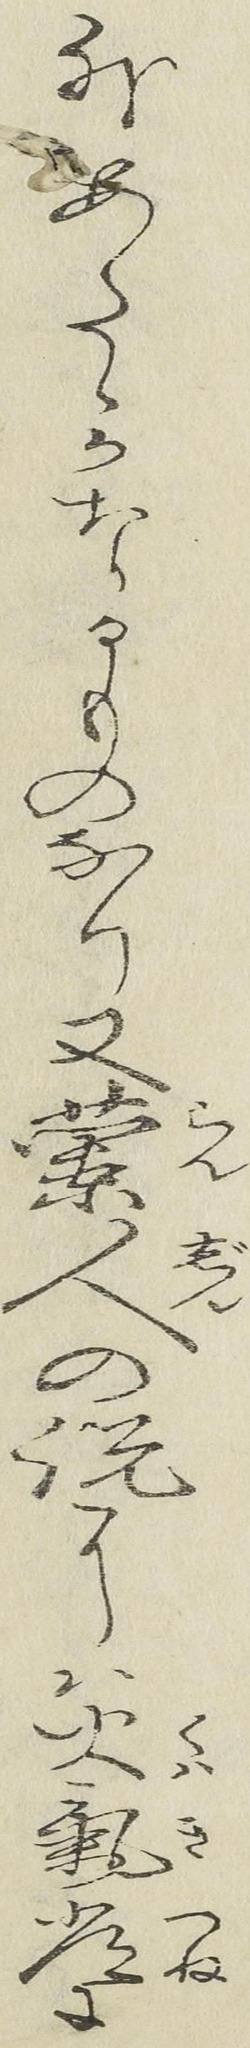外あたたかなるものなり又蘭人の説には火気常に
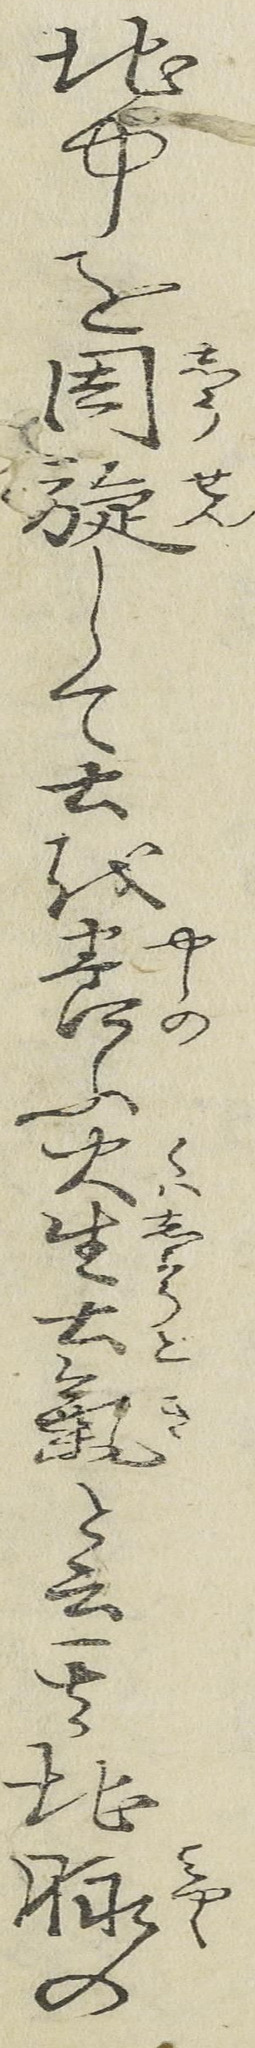地中を周旋して土を養ふ火生土気と云其地脈の

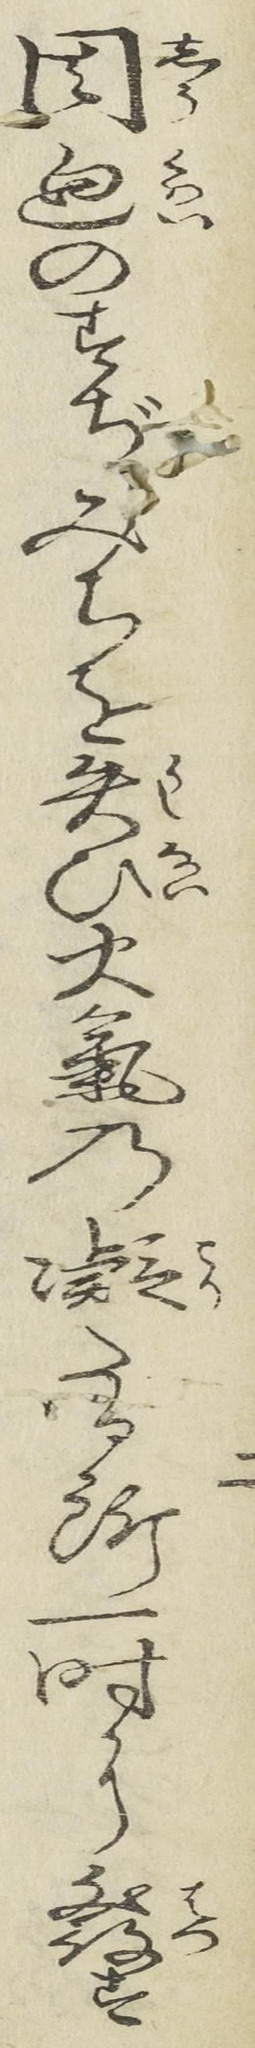周廻のすぢみちを失ひ火氣の凝たる所一時に發す
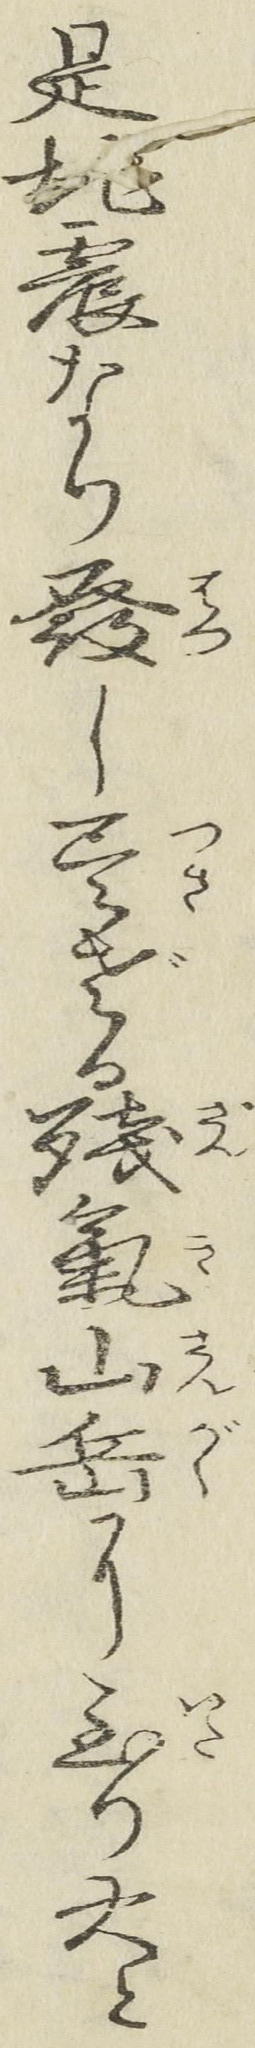是地震なり發し尽ざる残氣山岳に至り火と
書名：震雷考説　全
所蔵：東京大学地震研究所図書室 Earthquake Research Institute Library, The University of Tokyo, JAPAN
